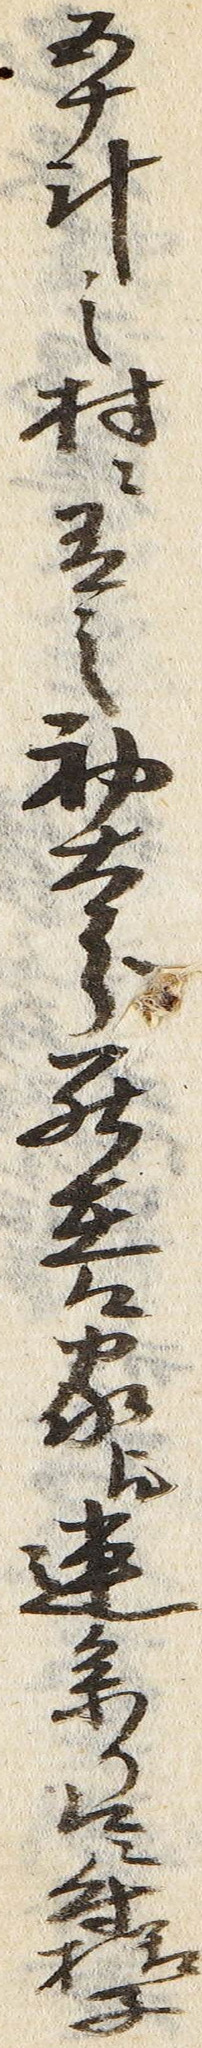五十計之村ニ有之初太郎罷在候家江連参り候ニ付様子
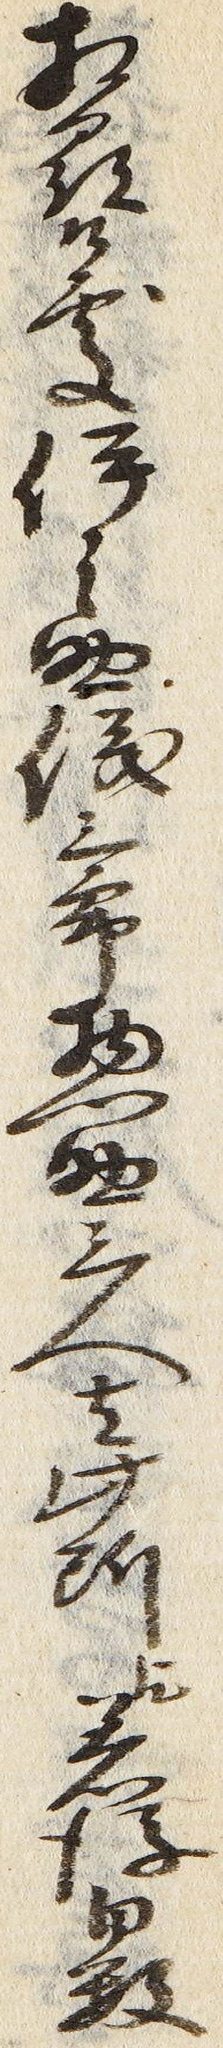相尋候處伊之助儀三郎惣助三人者此所江着後日数
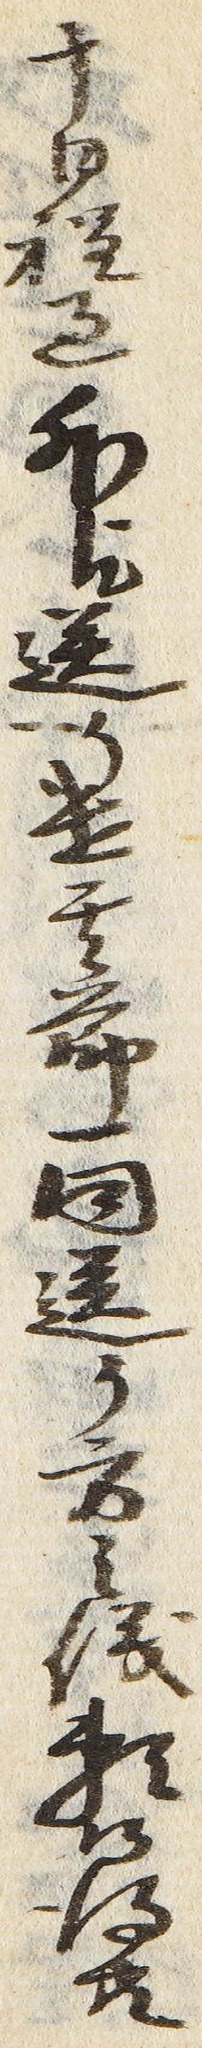十日程過外江送り遣其節一同送り方之儀頼候得共
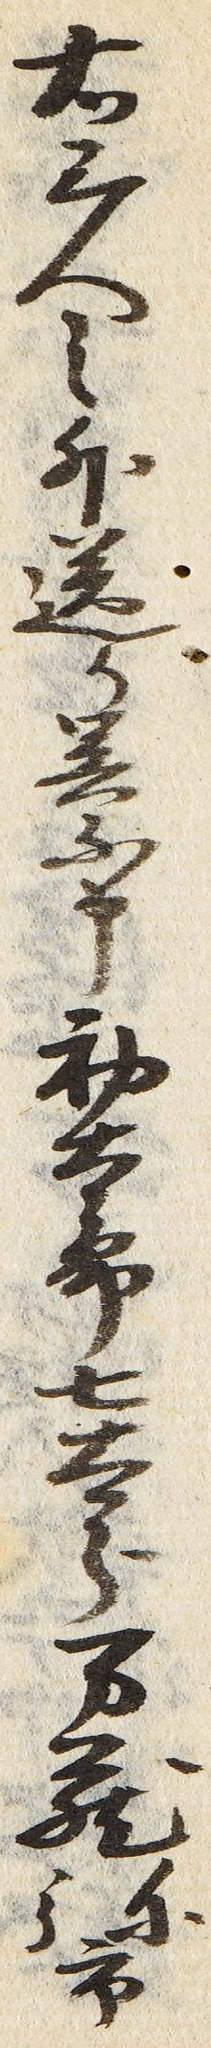右三人之外送り呉不申初太郎七太郎万蔵弥市
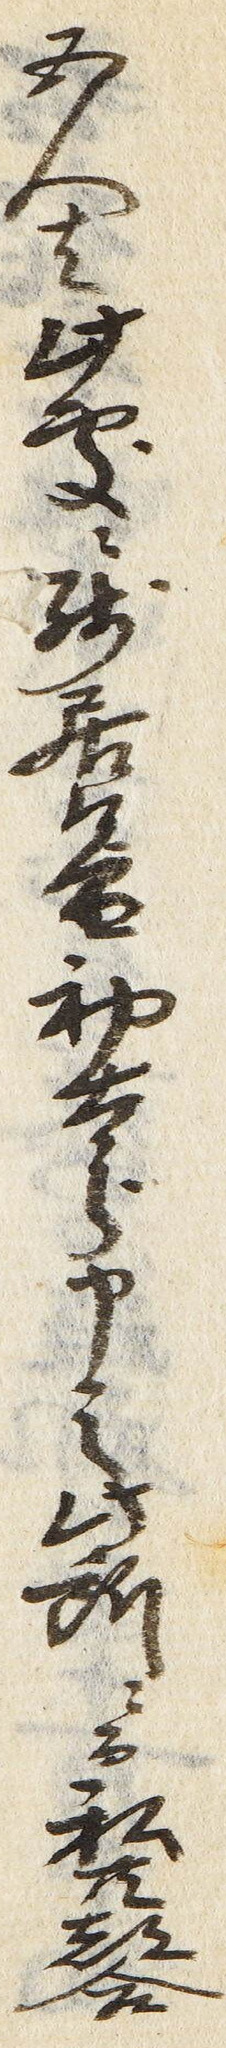五人者此處ニ残居候旨初太郎申之此所ニ而私共都合
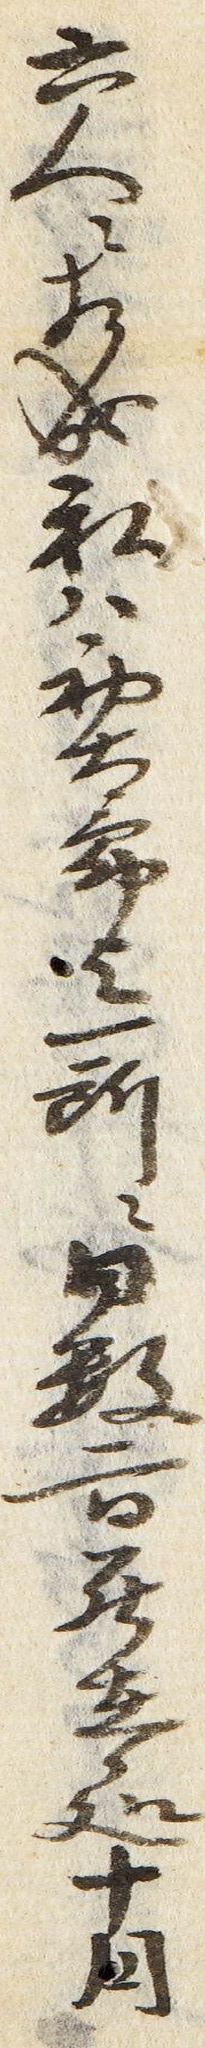六人ニ相成私ハ初太郎と一所ニ日数二日罷在候処十月
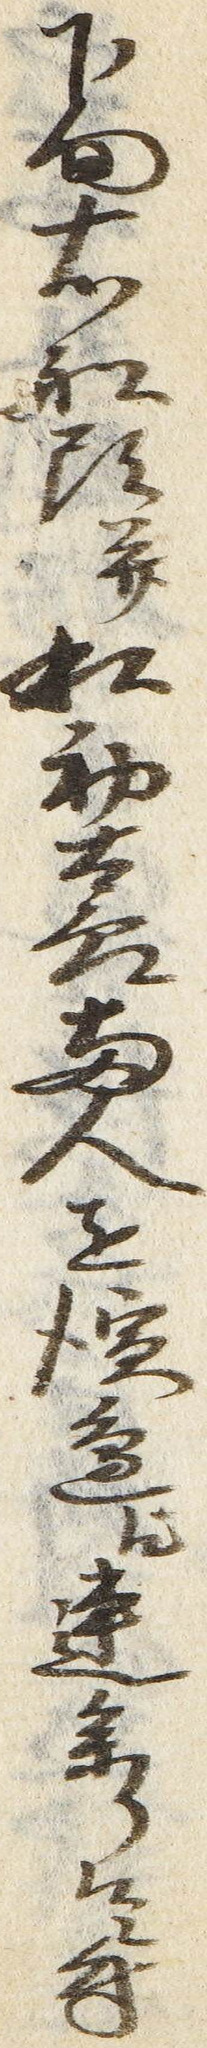下旬右舩頭幷私初太郎両人を濱邊江連参り候ニ付
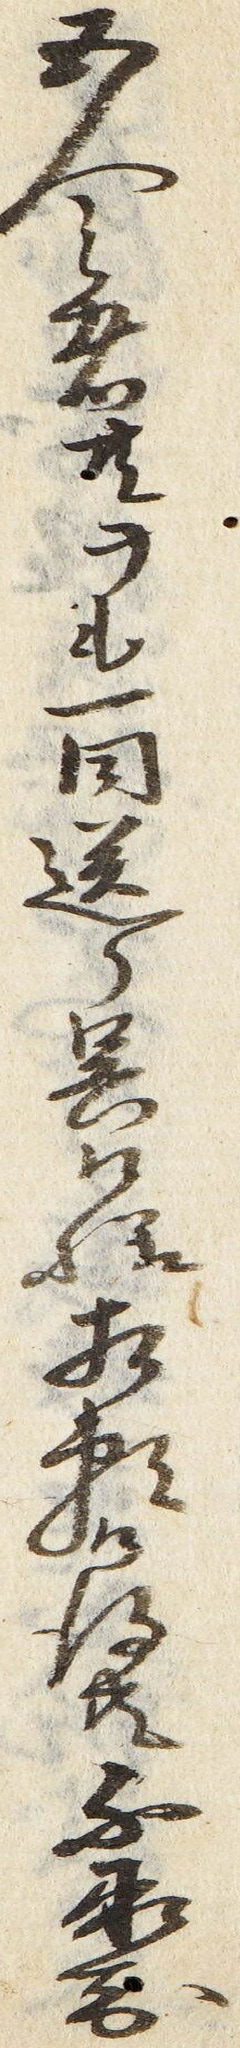五人之者共ヲも一同送り呉候様相頼候得共不承知

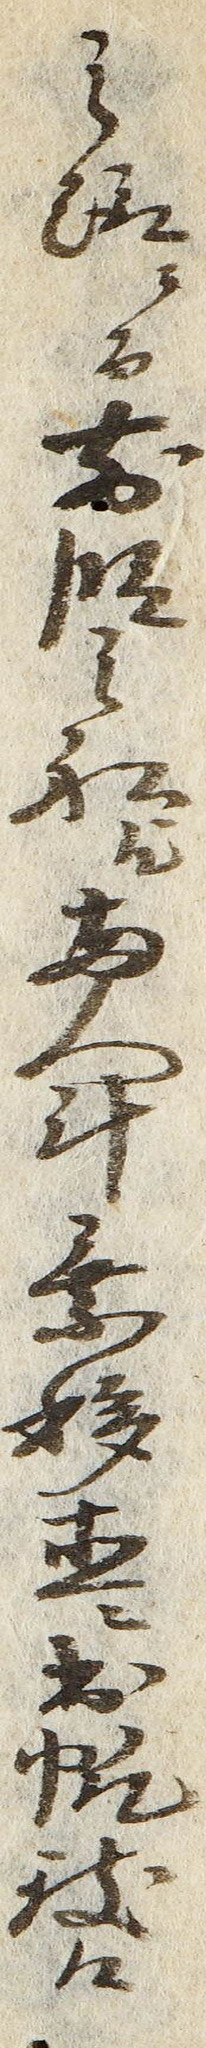之趣ニ而前段之舩江両人斗乗移直ニ出帆致候
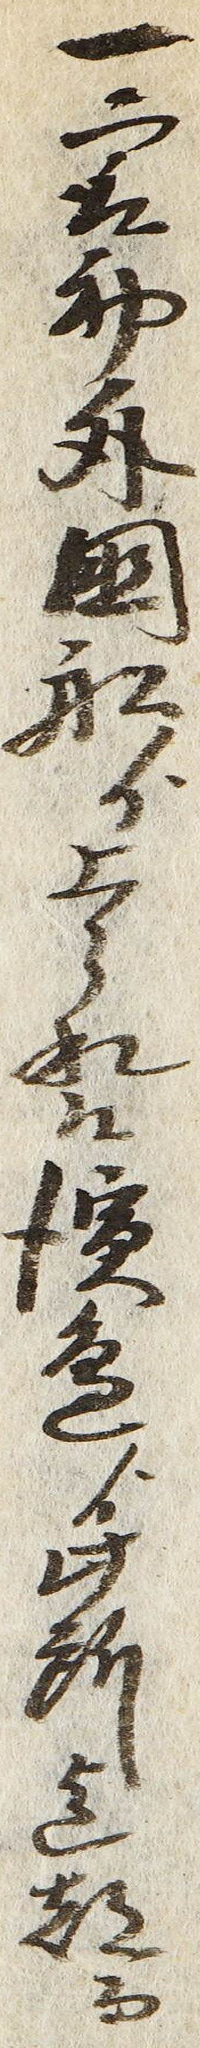一最初外国舩ゟ上られ候濱邊ゟ此所迄都而
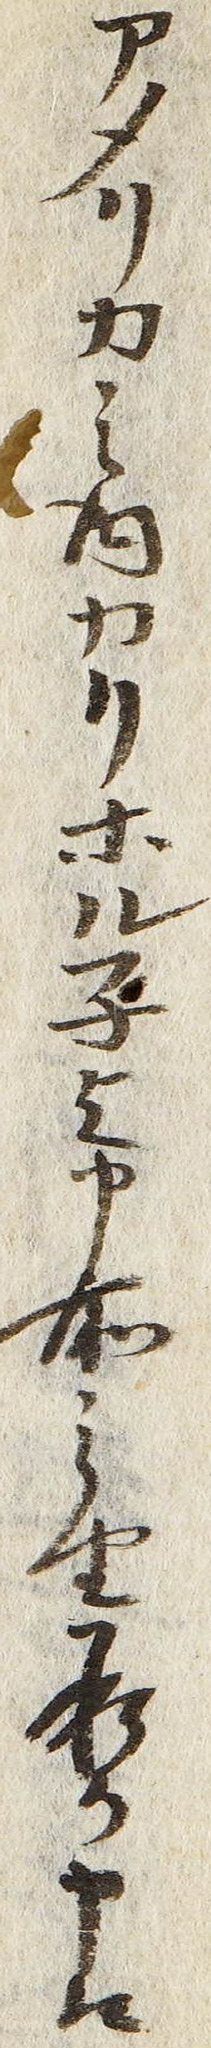アメリカ之内カリホル子と申所之由承り申候
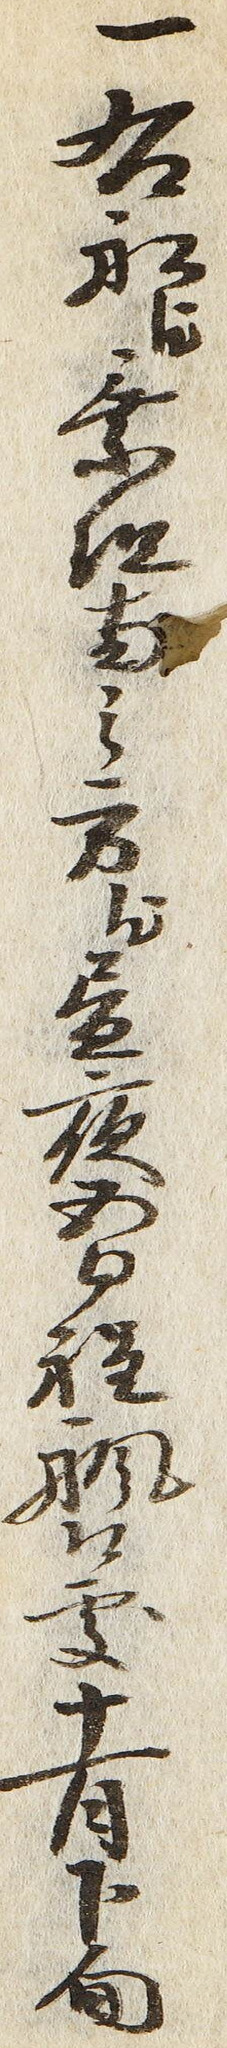一右舩江乗組南之方江晝夜五日程䑺候處十一月下旬
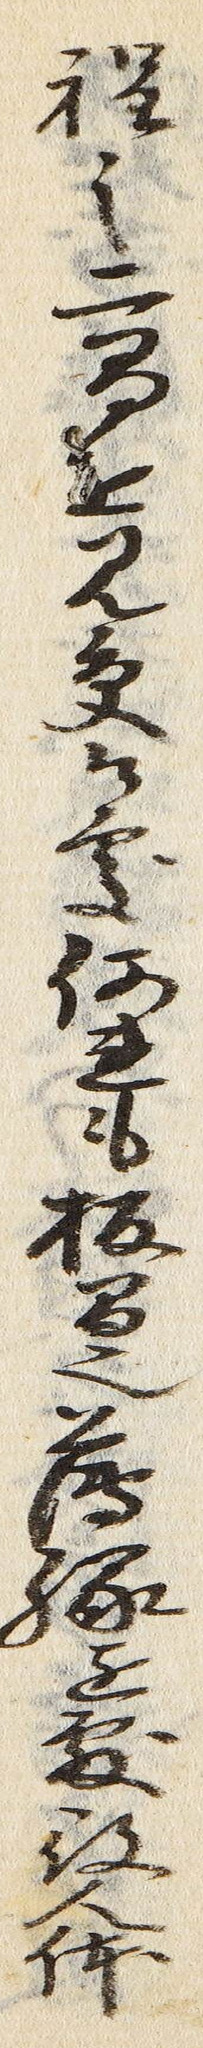程之二間と見受候處何れも板間也薄縁を敷役人体
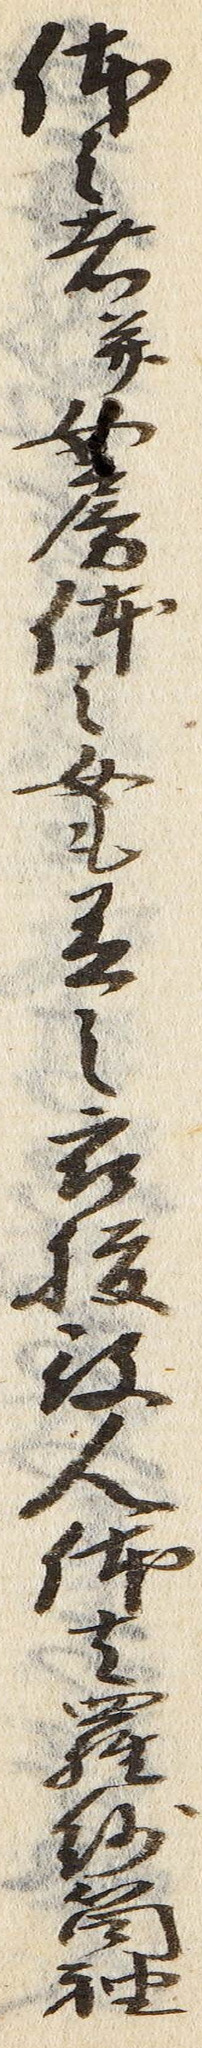体之者幷女房体之女も有之衣服役人体者羅紗筒袖
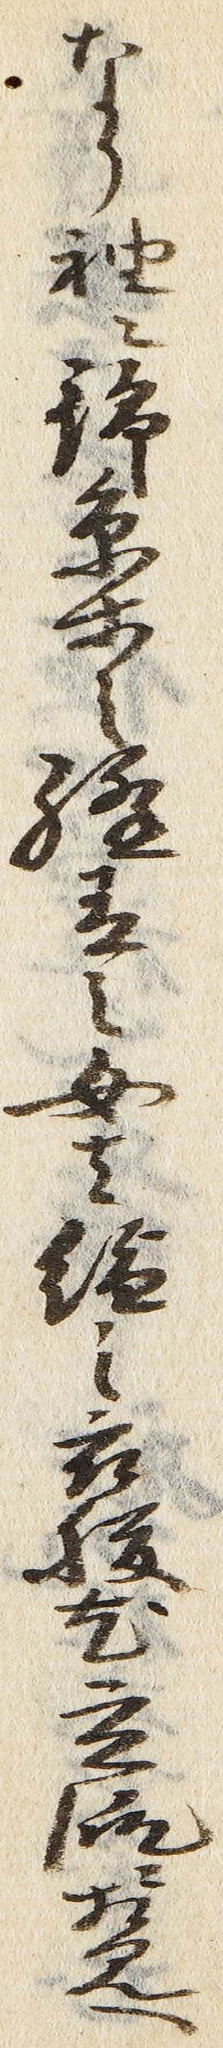なり袖ニ錦糸等之縫有之女者絹之衣服尤立派ニ相見へ
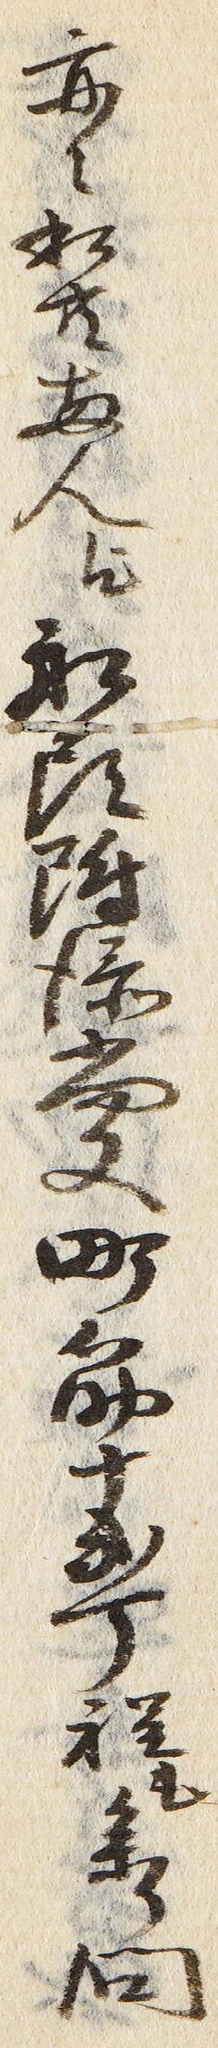亦々私共両人江舩頭附添尚又町筋十弐丁程も参り問
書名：漂流人善助聞書
